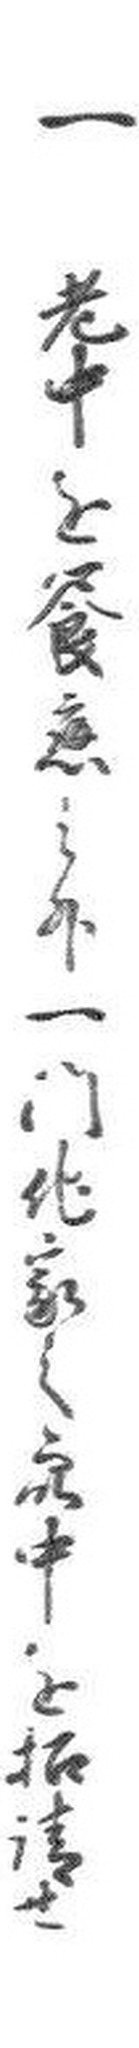一老中を饗応之外一門他家之衆中を招請せ
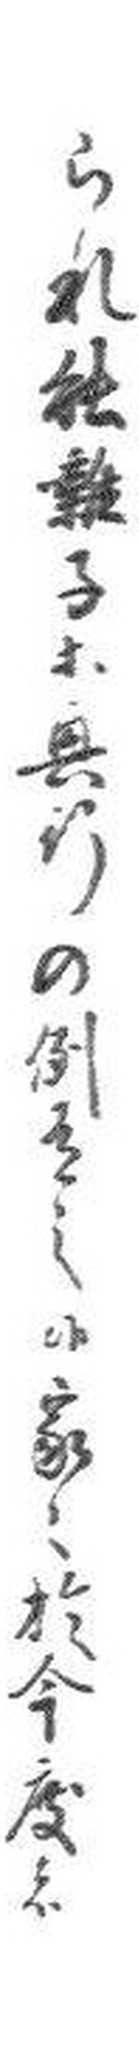られ能囃子等興行の例有之候家之於今度者
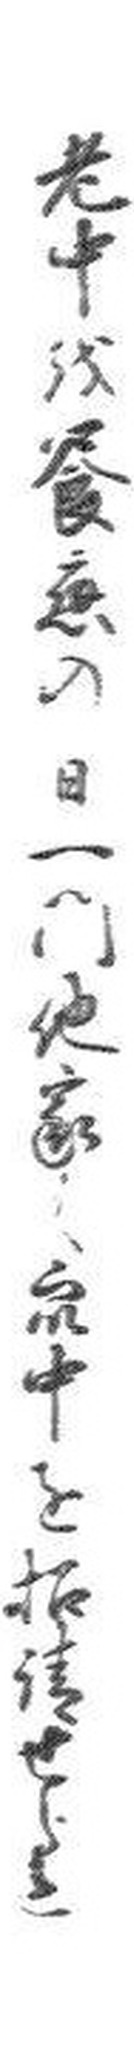老中を饗応の日一門他家之衆中を招請せられ
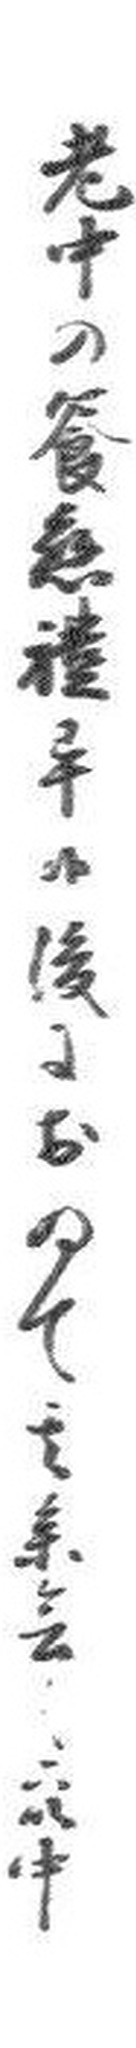老中の饗応礼畢候後において其参会之衆中

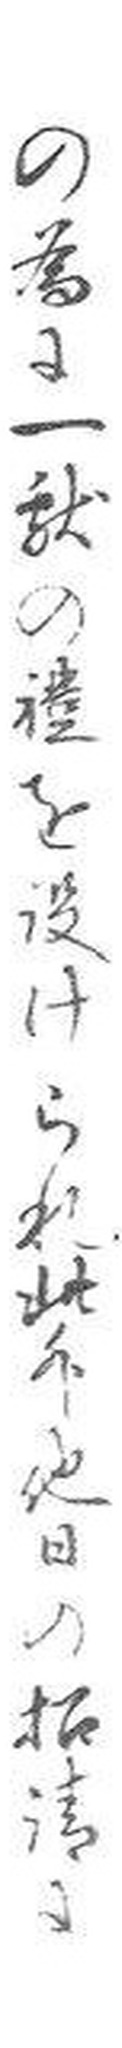の為に一献の礼を設けられ此外他日の招請に
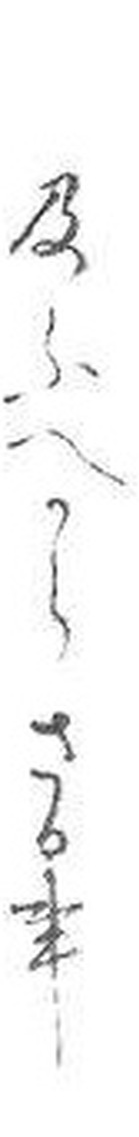及ふへからさる事
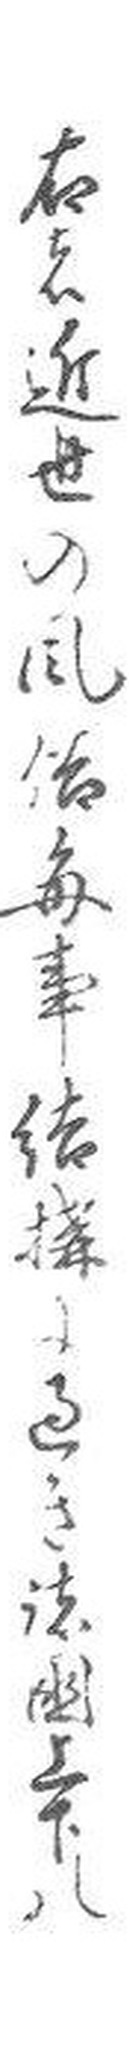右者近世の風俗毎時結構に過き諸国上下ハ
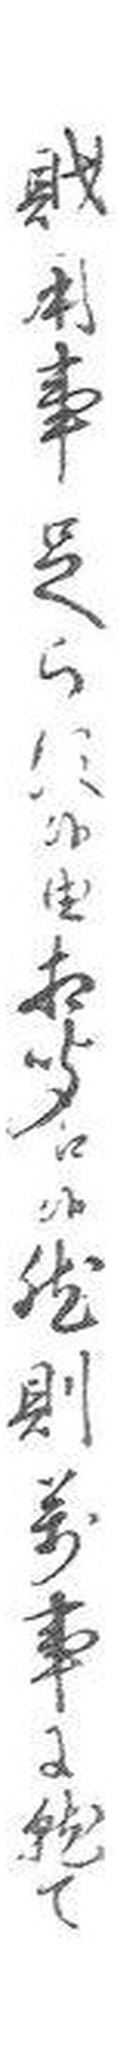財用事足らす候由相聞江候然則万事に就て
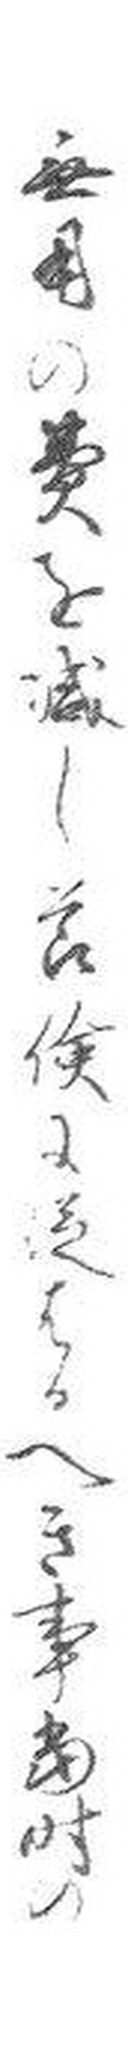無用の費を減し節倹に従はるへき事当時の
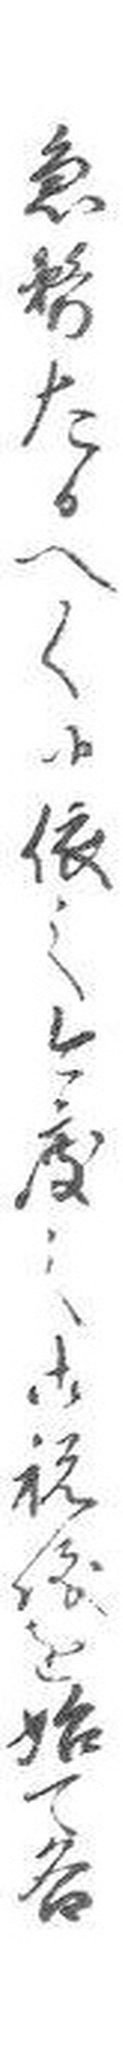急務たるへく候依之今度の御祝儀を始て各
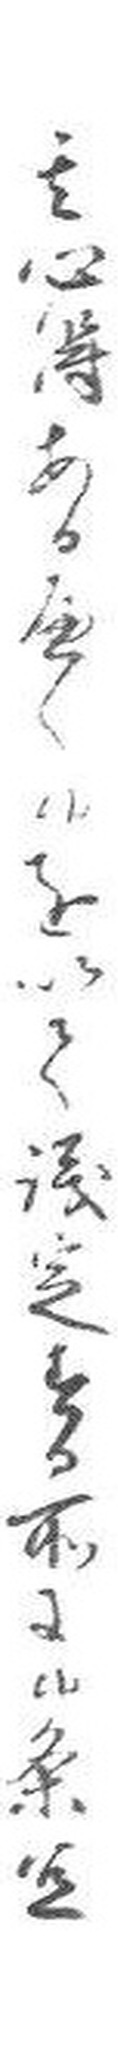其心得あるへく候を以て識定する所に候条宜
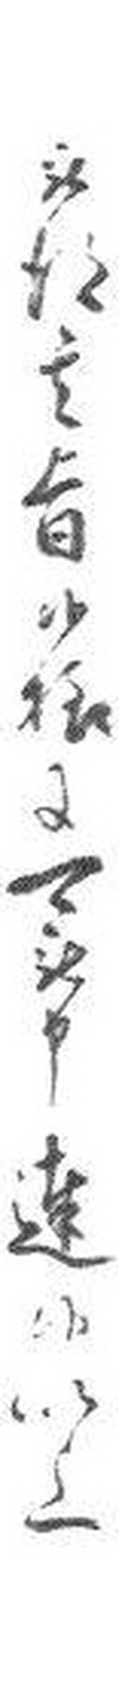被得其旨候様に可被申達候以上
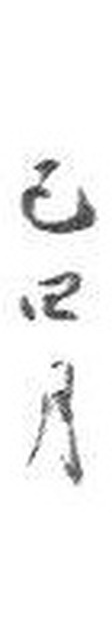巳四月
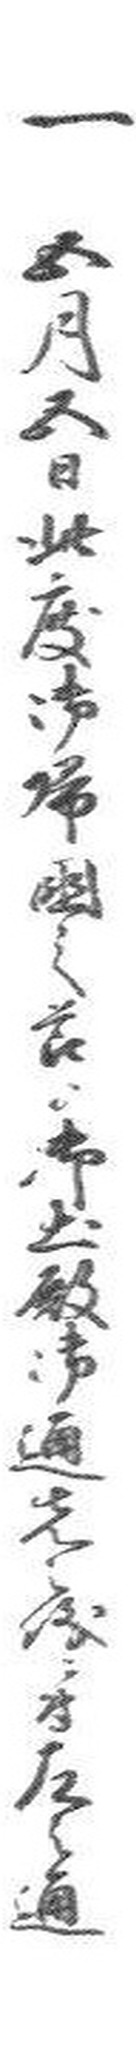一五月五日此度御帰国之節も御出殿御通先の儀ニ付左之通
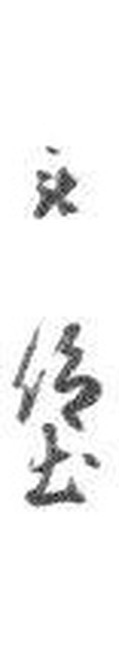被仰出
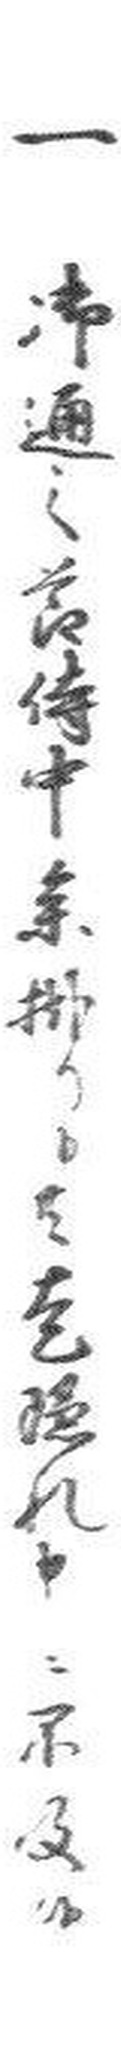一御通之節侍中参り候共走隠れ申ニ不及候
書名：家譜 二十九 吉邦公 従正徳二年到正徳三年
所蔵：福井県文書館 Fukui Prefectural Archives
